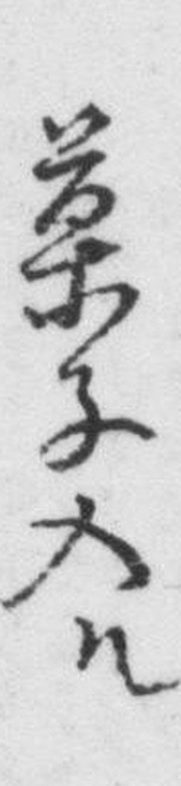菓子入る
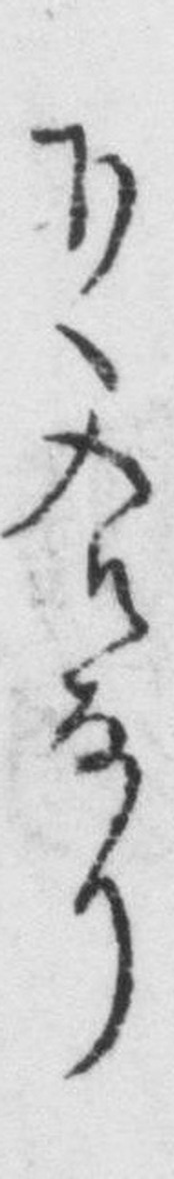下へ入るなり

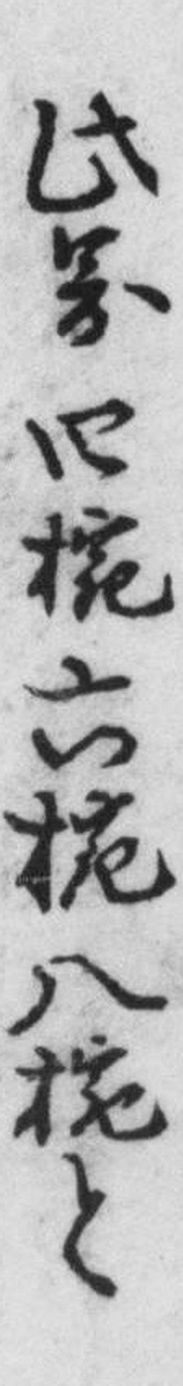此図四椀六椀八碗と
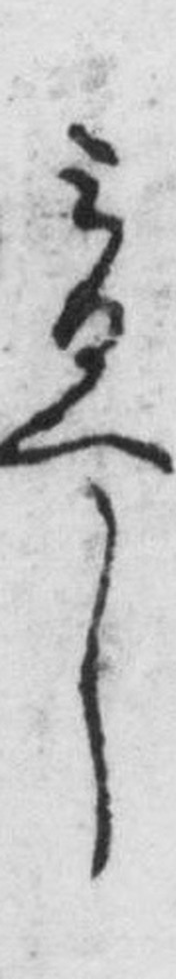みるへし
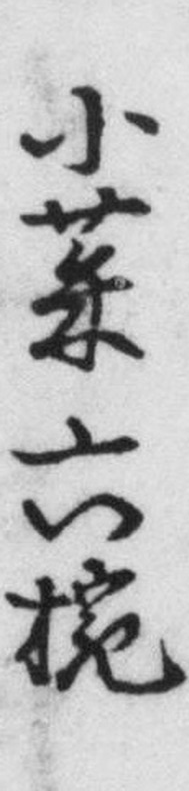小菜六椀
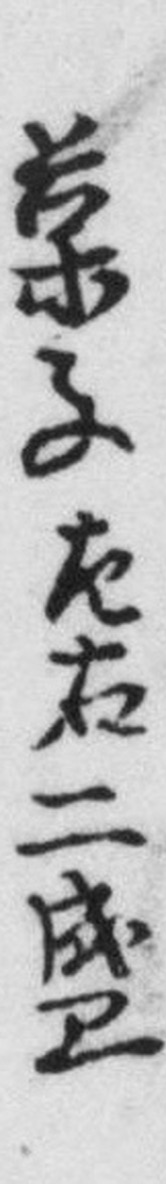菓子左右二盛
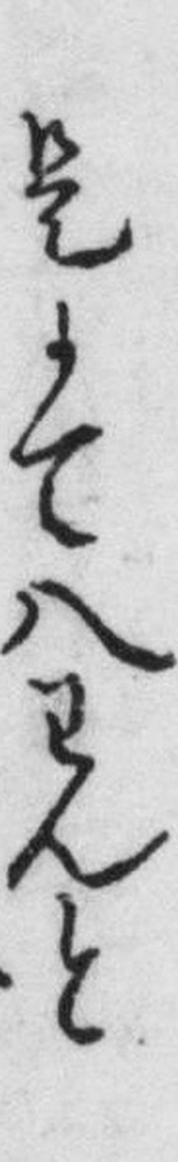是尓て八わんと
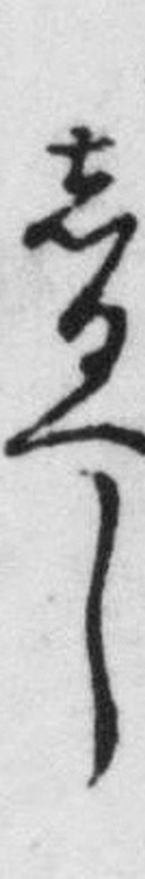みるへし
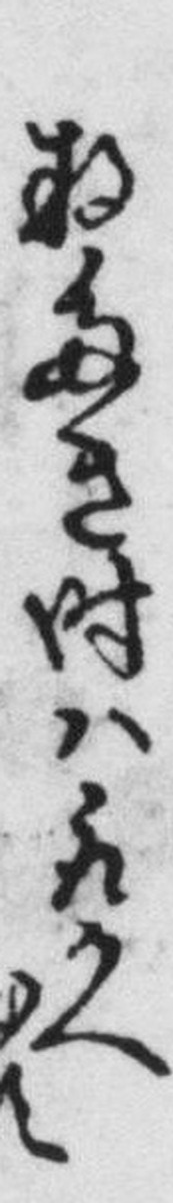数多き時は取かへ

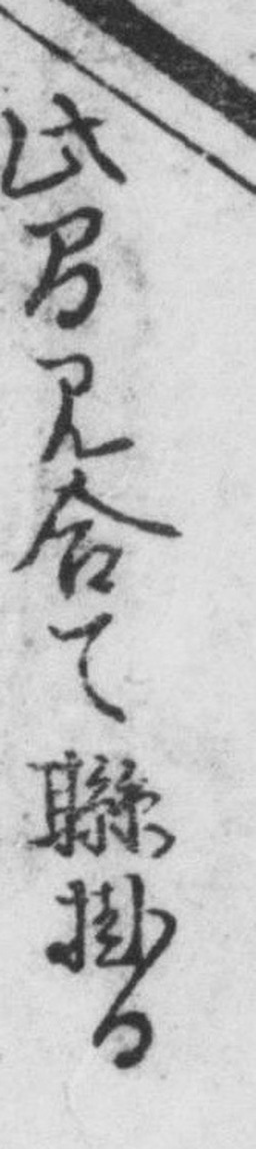此間見合て聯掛る
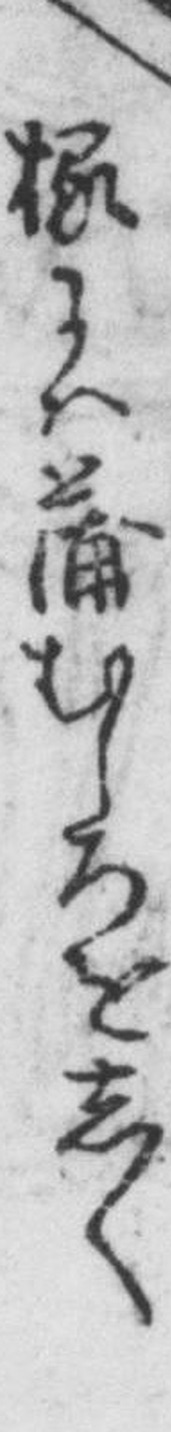様尓は蒲むしろを志く
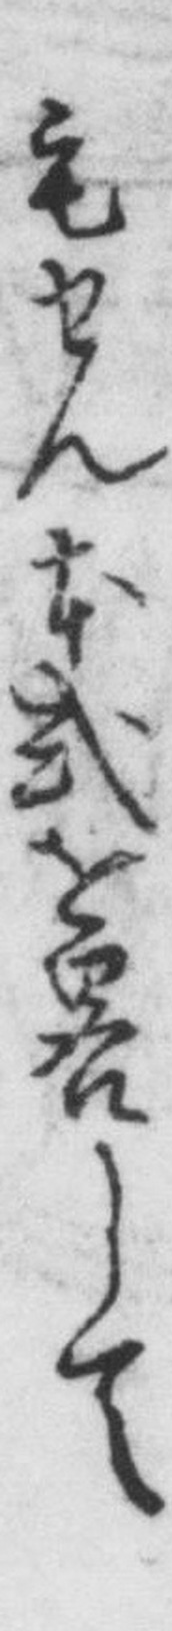毛せん本式を畧して
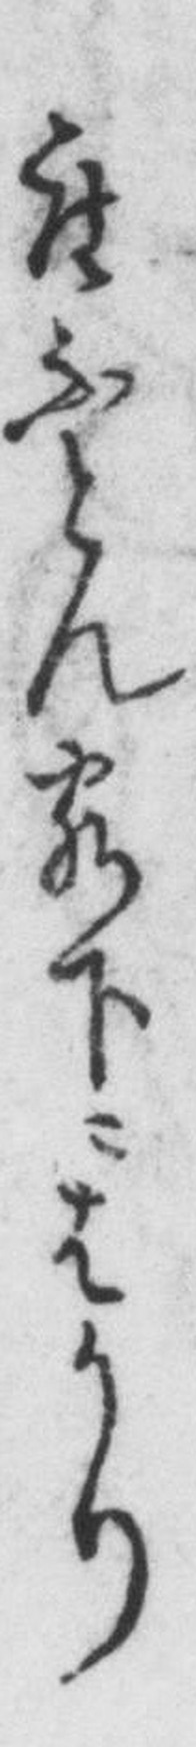座ふとん客下にはうり
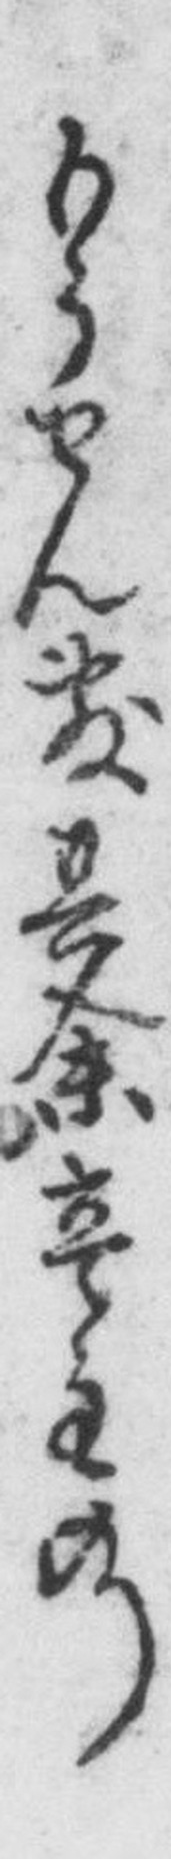もうせん處其余亭主之
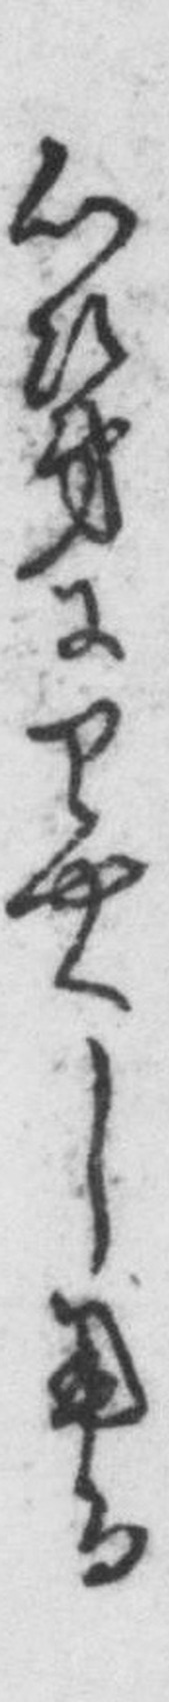心次第尓里やくし用る

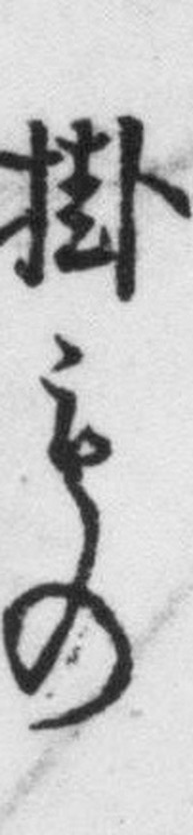掛もの
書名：普茶料理抄
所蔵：大阪府立大学学術情報センター 国文学研究資料館
